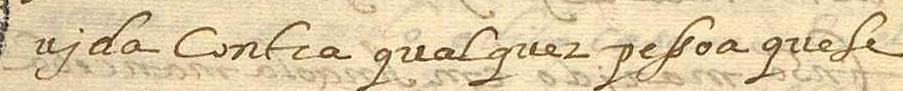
ujda Contra qualquer pessoa que se
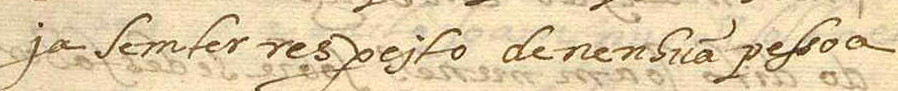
ja sem ter respejto de nenhuā pessoa
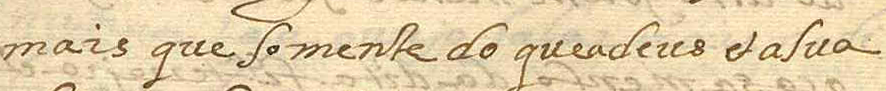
mais que somente do que adeus & a sua
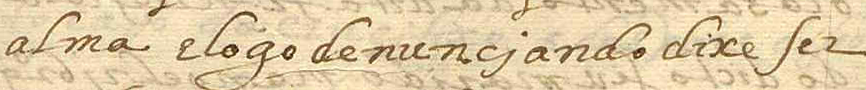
alma E logo denuncjando dixe ser
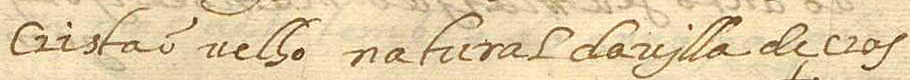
Cristaõ uelho natural da ujlla de cras
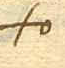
to
